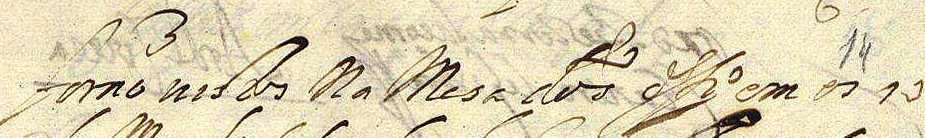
foraõ uistos na mesa do sto offo em os 10
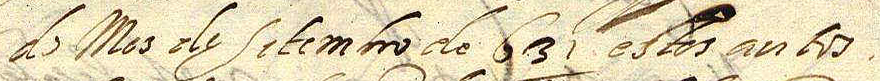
do mes de Setembro de 631 estes autos
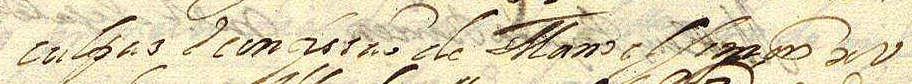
culpas e confissaõ de Manoel Simoĩs xv
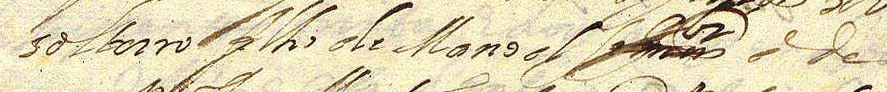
solteiro filho de Manoel _ glz̄ e de
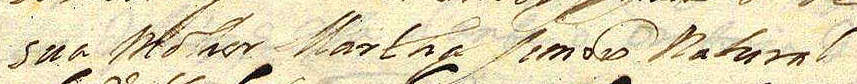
sua molher Martha Simoĩs natural
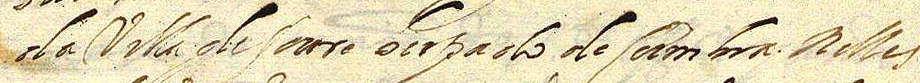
da Villa de Soure bispado de Coimbra nelles
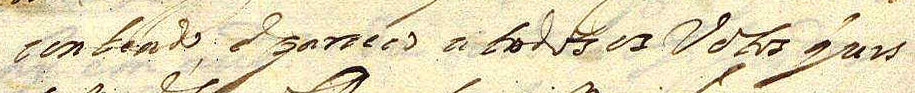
conteudo, e pareceo a todos os Votos q̄ uis
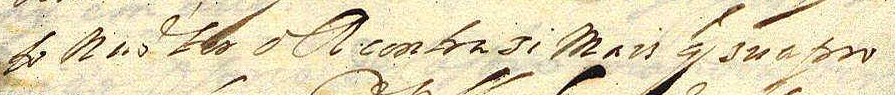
to naõ ter o R. contra si mais q̄ sua pro
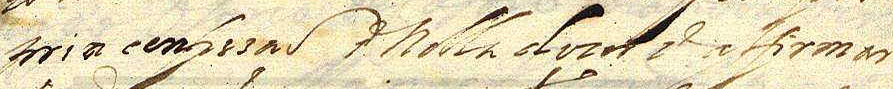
pria confissaõ e nella dizer e affirmar
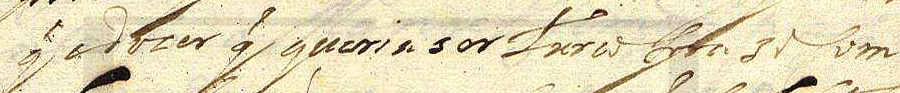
q̄ o dizer q̄ queria ser Turco foi so Com
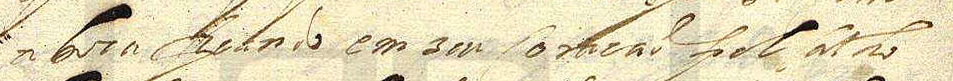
a boca ficando em seu Coraçaõ fiel Catho
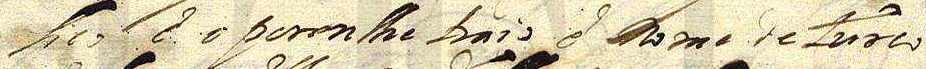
lico e o porenlhe traio e nome de turco
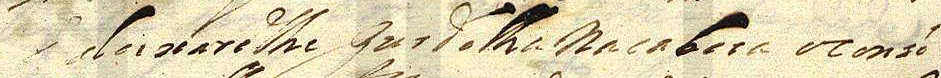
e deixarēlhe guedelha na cabeça o consē
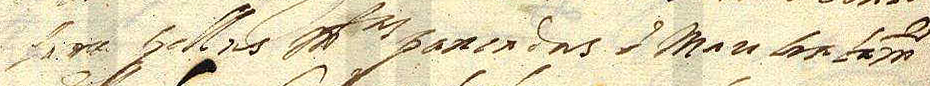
tira pellas mtas pancadas e mau tratamto
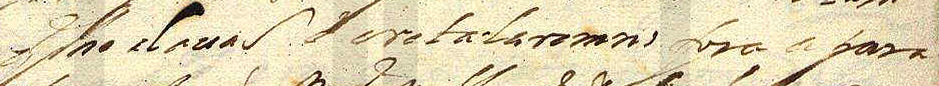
q̄ lhe dauaõ e o retalaremno fora a pura
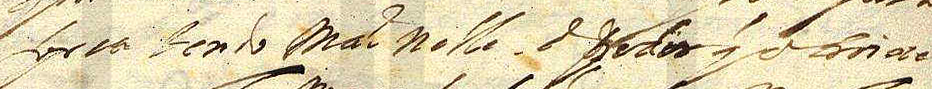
forca tendo maõ nelle E pedir q̄ o troixe
